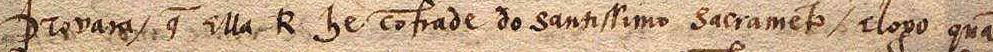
Provara / q̄ Ella R he c̄ofrade do santissimo Sacramēto / E logo quā
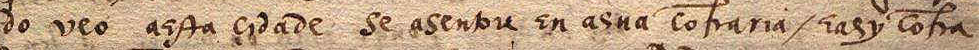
do veo a Esta cidade Se asentou En a sua c̄ofraria / E asy C̄ofra
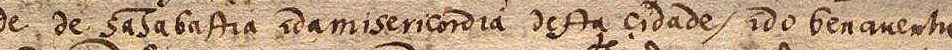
de de Sā Sabastia E da misericordia desta Çidade / E do ben auentu
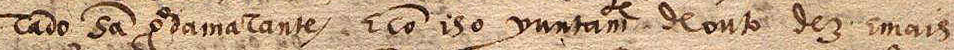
rado S̄a go damarante / E c̄o iso yuntamte de outo dez E mais
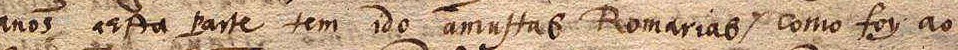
anōs a Esta parte tem ido a muJtas Romarias / como foy ao
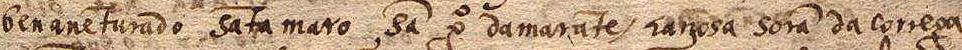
ben auēturado S̄atamaro S̄a go damarāte / E a nosa sorā da correga
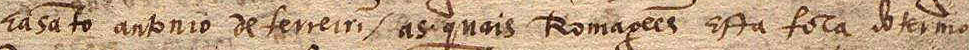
E a s̄ato antonio de ferriri| / as quais Romagēes Esta fora do termo
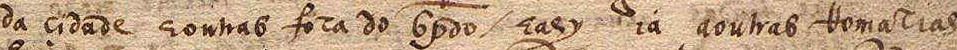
da Çidade E outras fora do b̄pado / E asy ia a outras Romarias
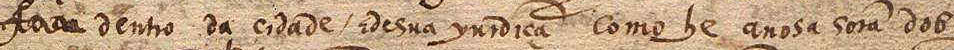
Jaa dentro da çidade / E de sua yurdiçā como he a nosa sorā dos
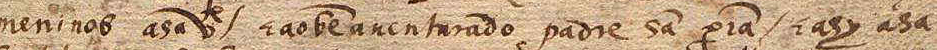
meninos a sā vte / E ao b̄e auenturado padre sā gīa / E asy a s̄a
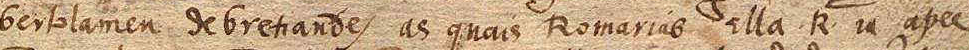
bertolmaeu de bretiande / as quais Romarias Ella .R. ia a pee
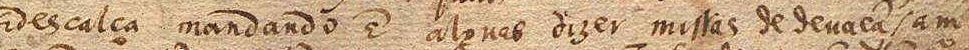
E descalça mandando Ē alguas dizer missas de deuaçā / am
